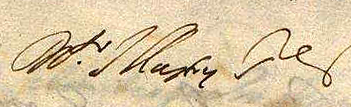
M.to Illustres sres
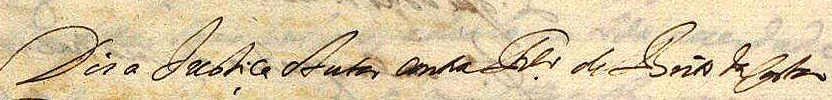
Dis a Iustiça Autor contra Fr.co de Brito da Costa
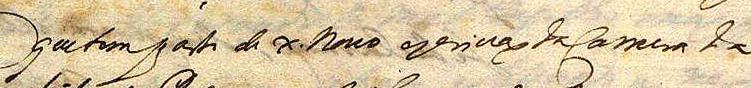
que tem parte de x. nouo escriuaõ da Camera da
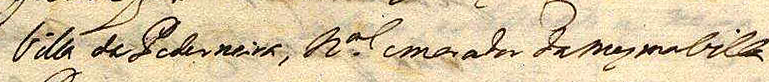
Villa da Pederneira, n.al e morador da mesma villa
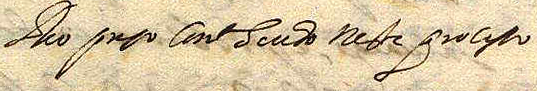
Reo preso contheudo neste processo
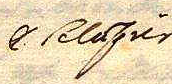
e se cōprir
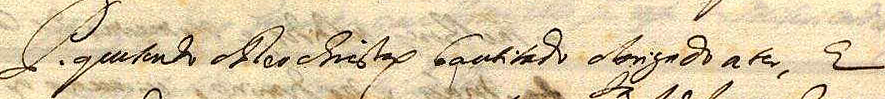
P. que sendo o Reo christaõ bautisado obrigado a ter, E
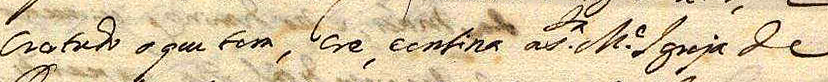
crer tudo o que tem, cre, e ensina a s.ta M.e Igreja de
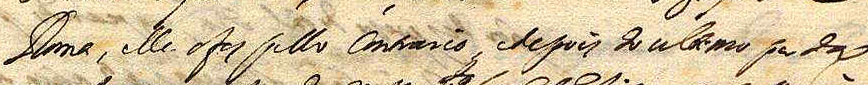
Roma, elle o fes pello contrario, e depois do ultimo perdaõ
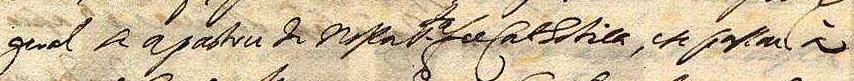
geral se apartou de nossa s.ta fee Catholica, e se passou à
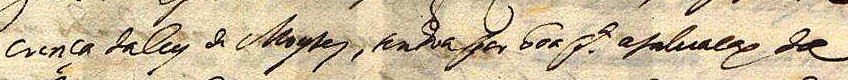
crença da ley de Moyses, tendoa por boa p.a a saluaçaõ da
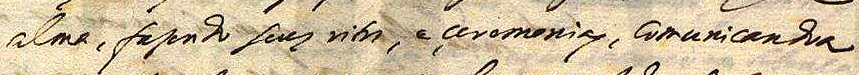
alma, fasendo seus ritos, e ceremonias, comunicandoa
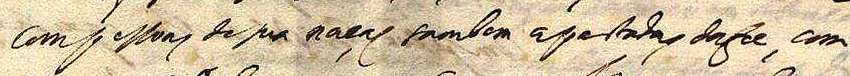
com pessoas de sua naçaõ tambem apartadas da fee, com
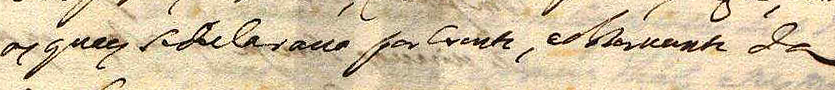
as quaes se declaraua por crente, e obseruante da
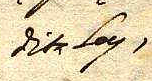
dita ley,
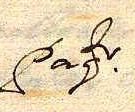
porqto.
